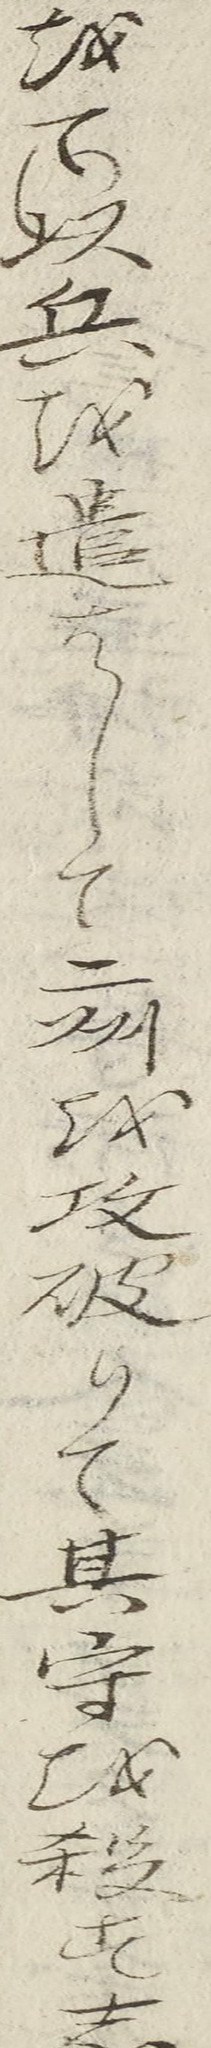を以て兵を遣はして二州を攻破りて其守を殺すし
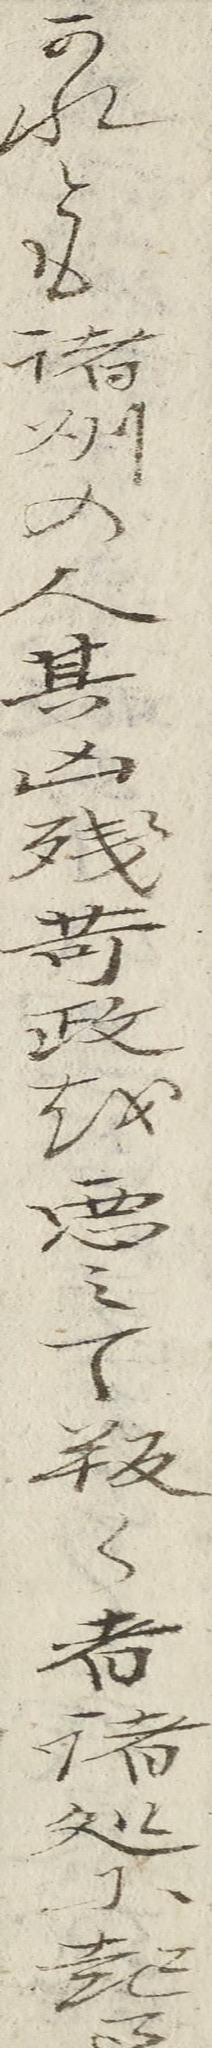かれとも諸州の人其凶残苛政を悪ミて叛く者諸処に起る
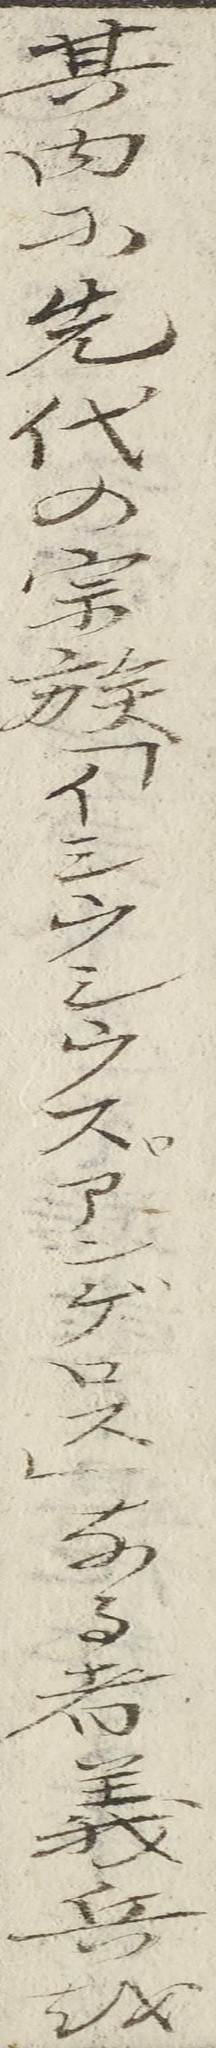其内に先代の宗族「イシウシウス。アンゲロス」なる者義兵を
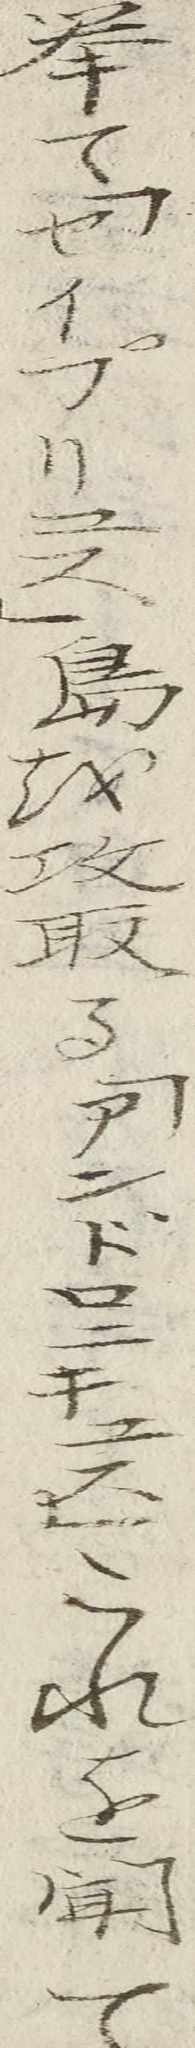挙て「セイプリュス」島を攻取る「アンドロ二キュス」これを聞て
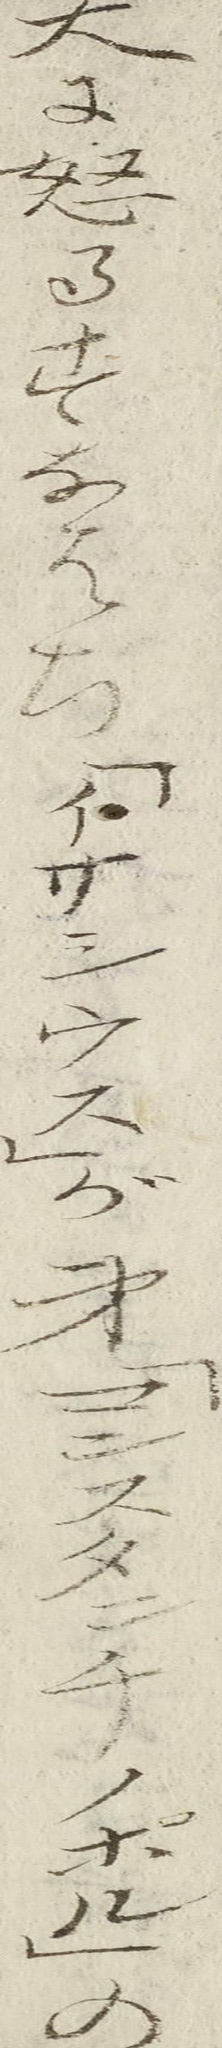大に怒るすなはち「イサシウス」ガ弟「コンスタン二チノボル」の
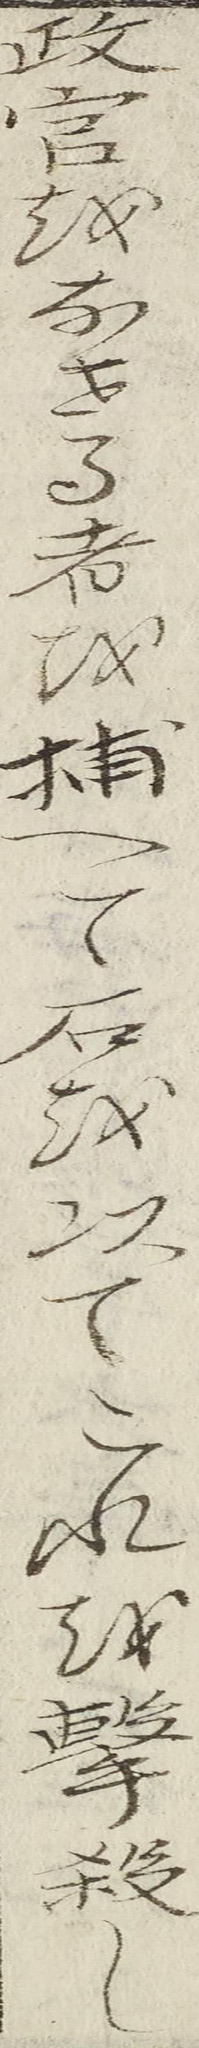政官をなせる者を捕へて石を以てこれを撃殺し
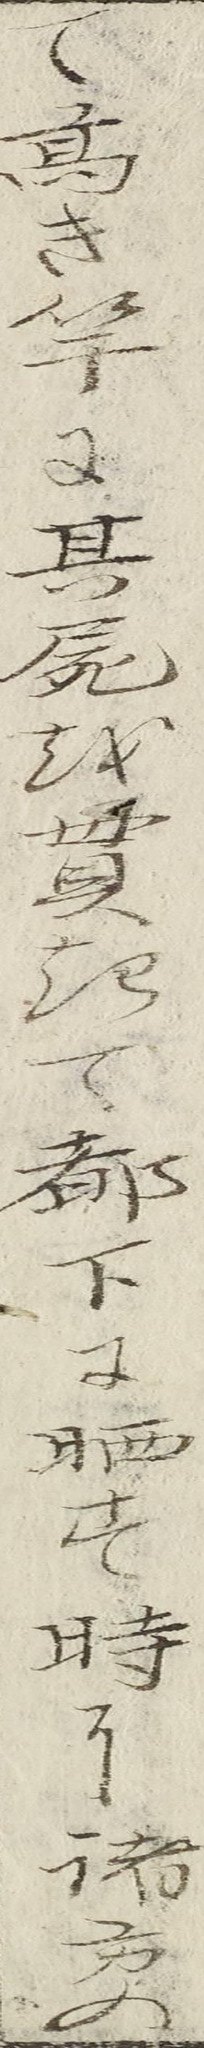て高き竿に其屍を貫きて都下に晒す時に諸方の
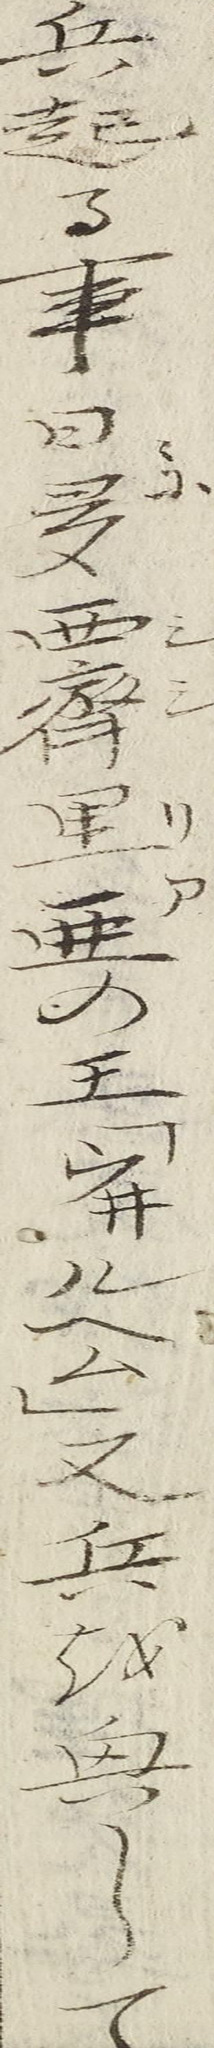兵起る事日々に多西斎里亜の王「ウ井ルヘム」又兵を興して
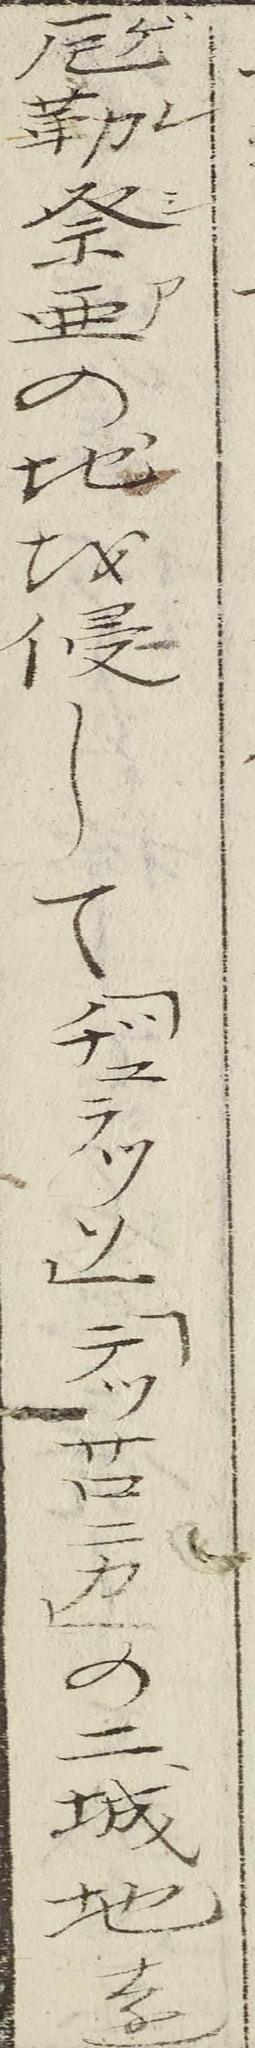厄勒祭亜の地を侵して「ヂュラッソ」「テツサロ二カ」の二城地を
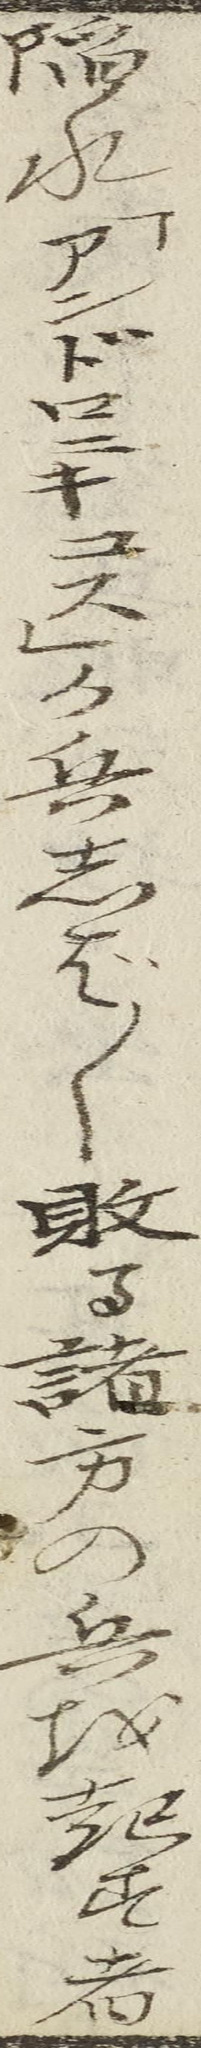陥れ「アンドロ二キュス」か兵しば〳〵敗る諸方の兵を起す者
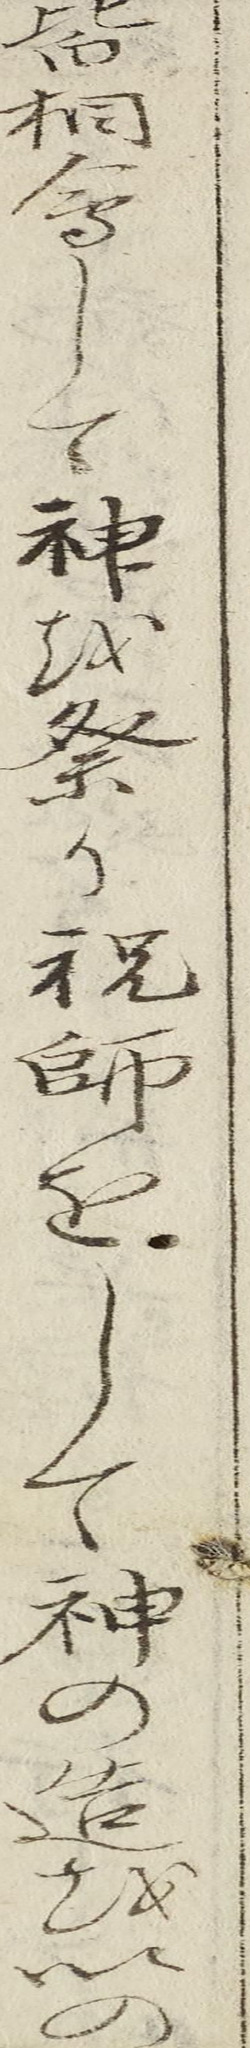皆相会して神を祭り祝師をして神の造をいの
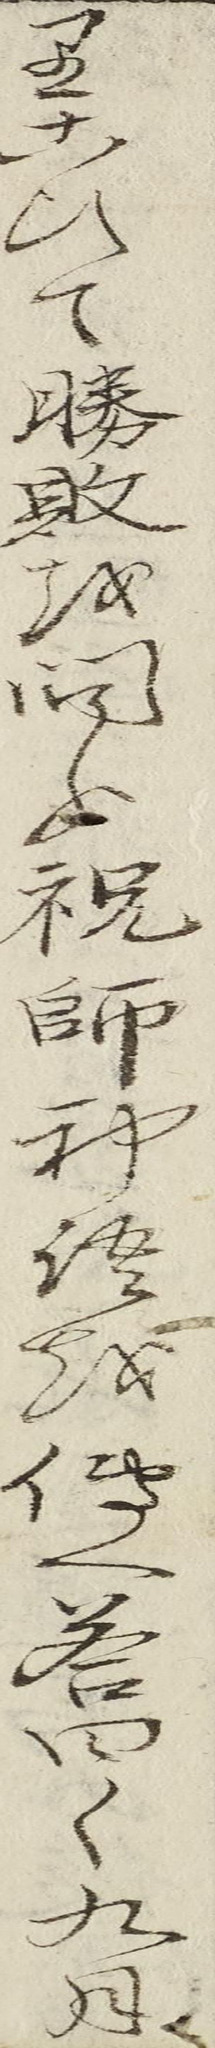りこひて勝敗を問ふ祝師神語を伝へ答曰く九月
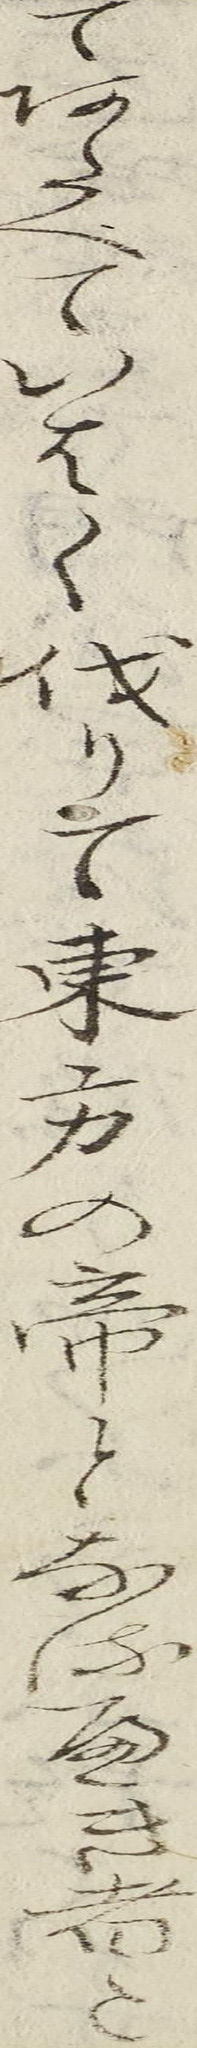てあたへていはく代りて東方の帝となるへき者た
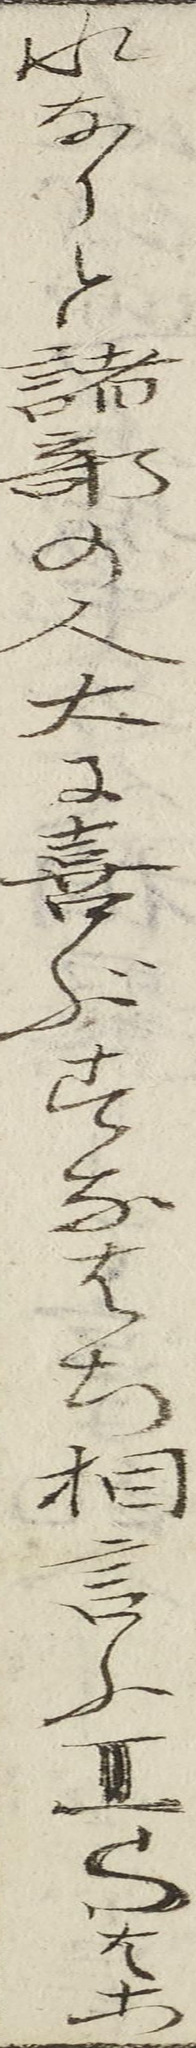れなりと諸部の人大に喜ぶすなはち相言ふＩＳはこ
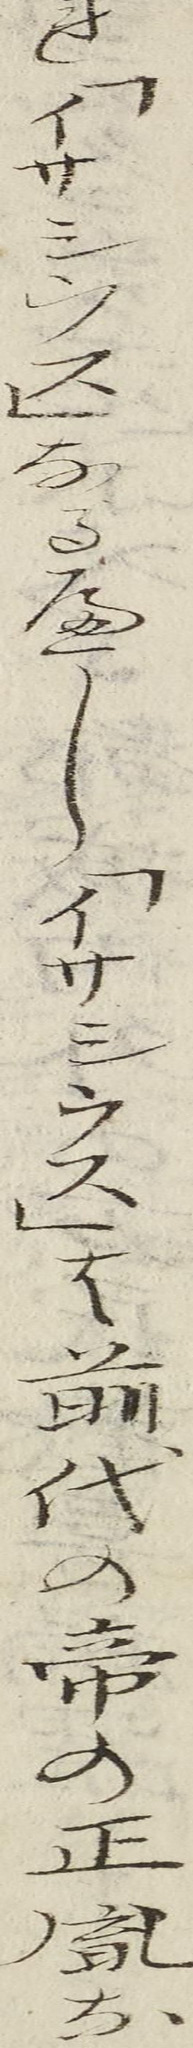れ「イサシウス」なるへし「イサシウス」は前代の帝の正胤な
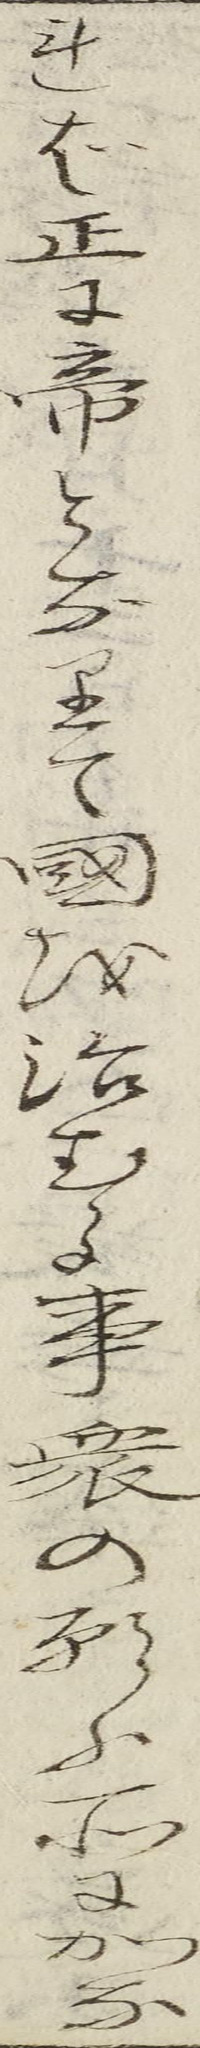れば正に帝となりて国を治むる事衆の願ふ所にかな
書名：西洋雜記　乾
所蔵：東京大学地震研究所図書室 Earthquake Research Institute Library, The University of Tokyo, JAPAN
